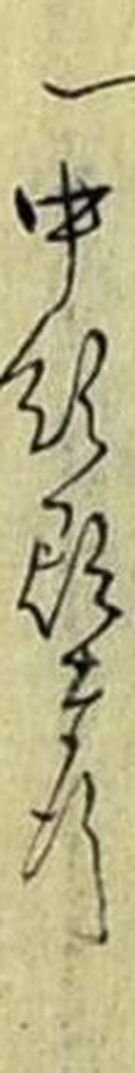中領郡奉行
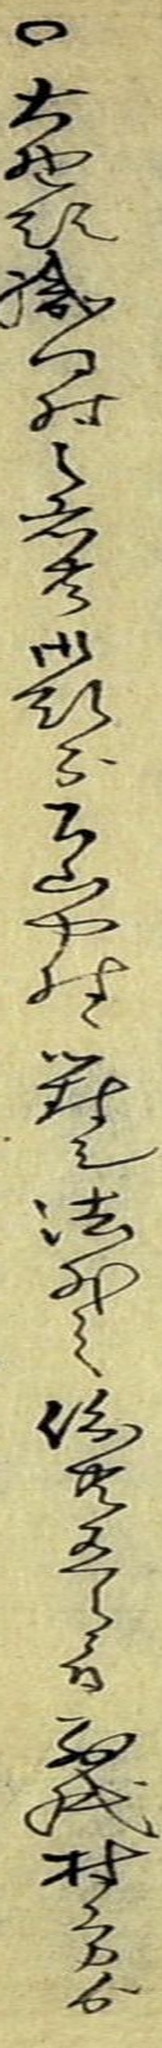○大野領織田村之者共御領分下山中村へ対し法外之儀共有之候に付別紙村方ゟ
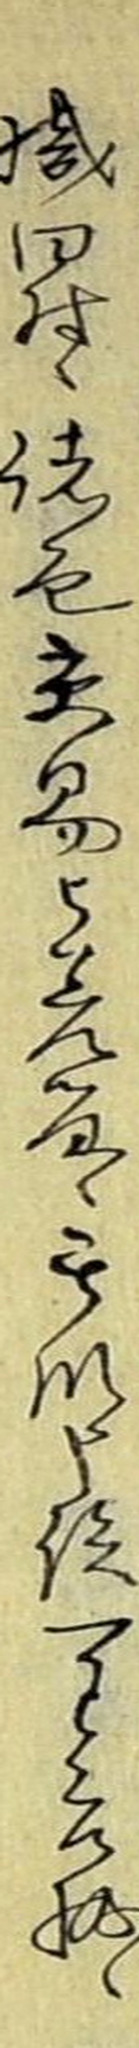織田村へ諸色交易被差留候其段申談可被取扱候
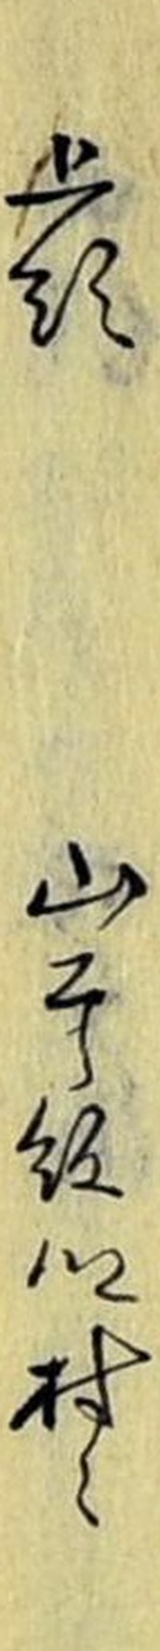上領山二組郷村々

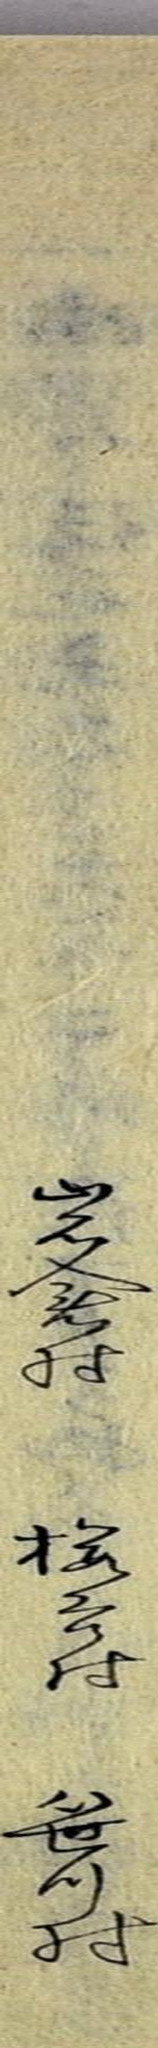岩倉村桜谷村笹川村
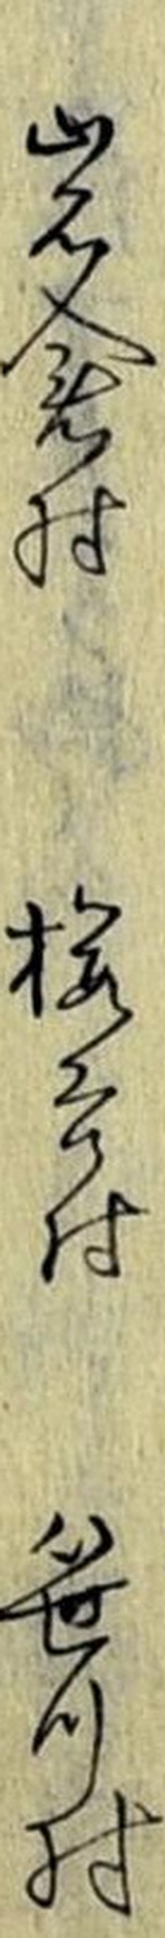岩倉村桜谷村笹川村
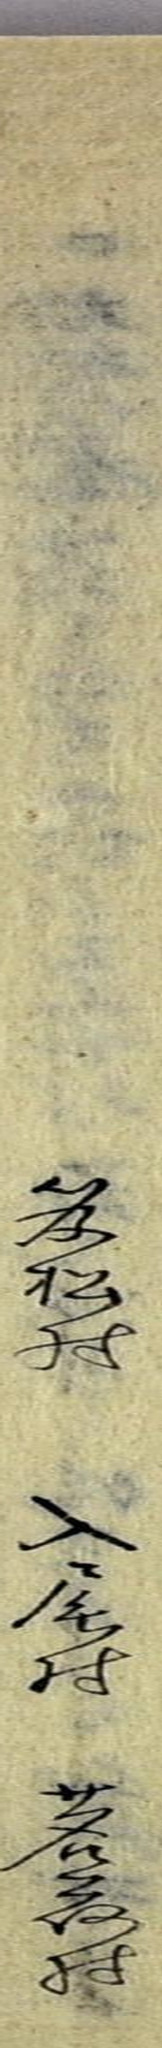笈松村入尾村茗荷村
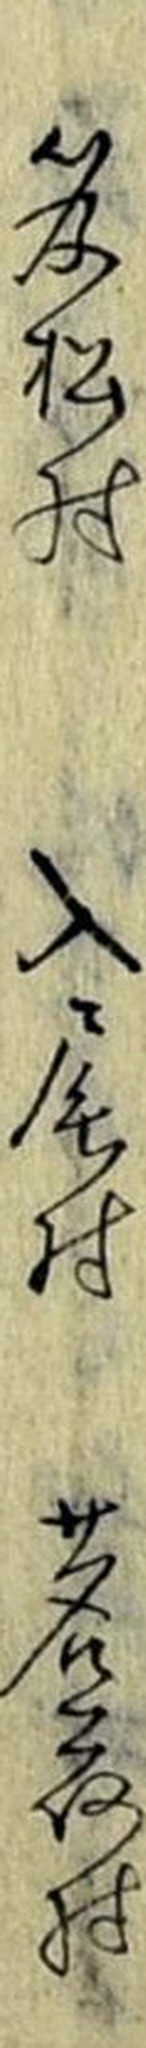笈松村入尾村茗荷村
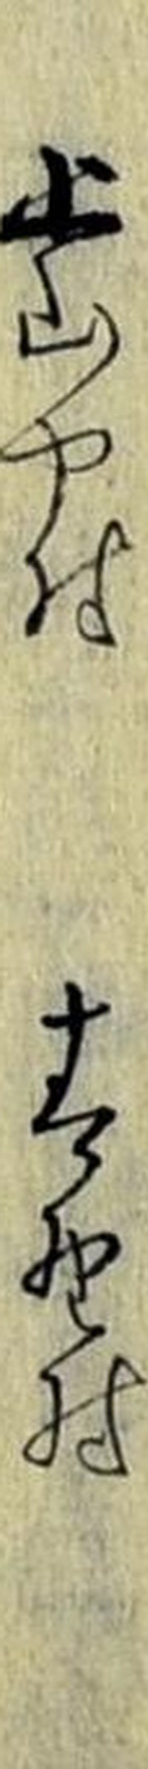上山中村青野村
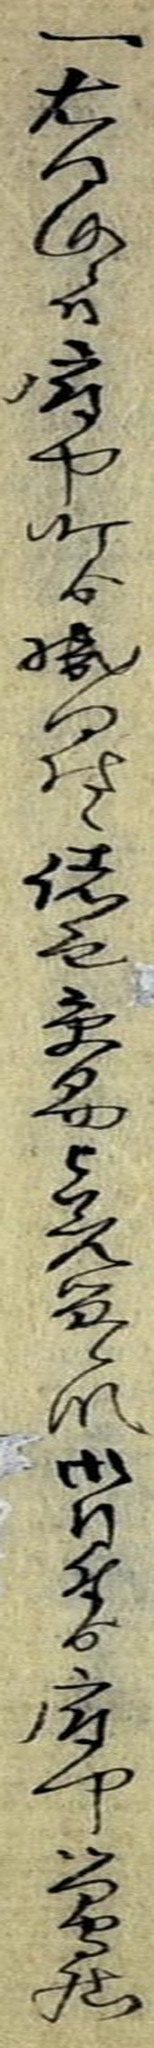右同趣に付府中町ゟ織田村へ諸色交易被差留候段御目付ゟ府中留守居
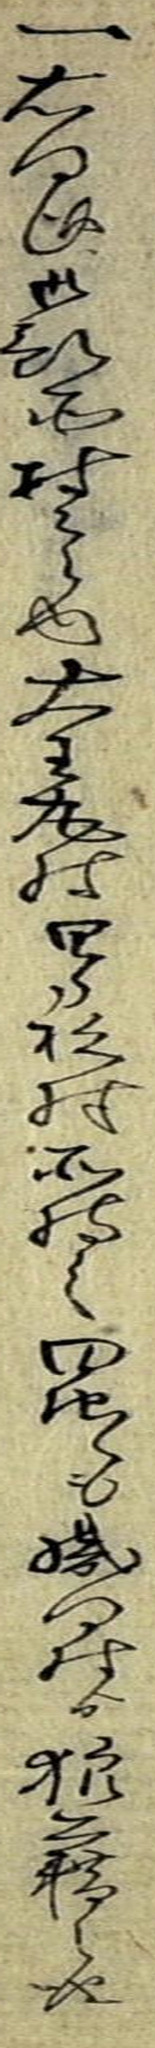一右同趣御預所村々之内大王丸村四ッ杉村所持之田地へも織田村ゟ狼藉之儀
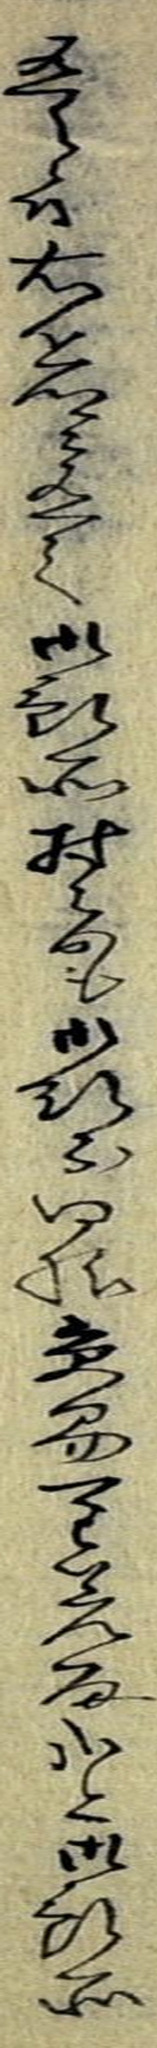有之候に付右近郷に有之御預所村々ゟも御領分同様交易可被差留哉と御預所
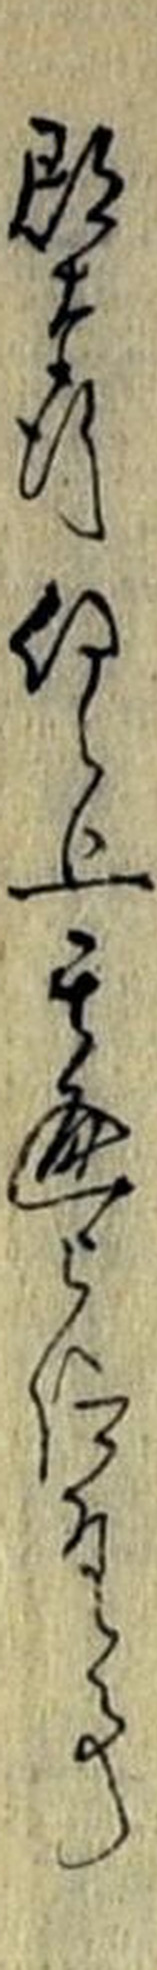郡奉行伺之上其通被仰付候事
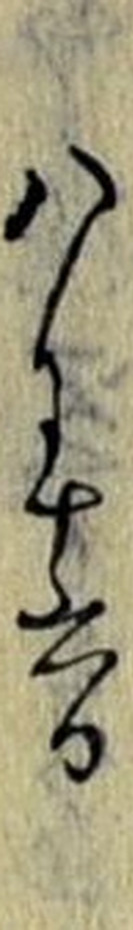八月十六日
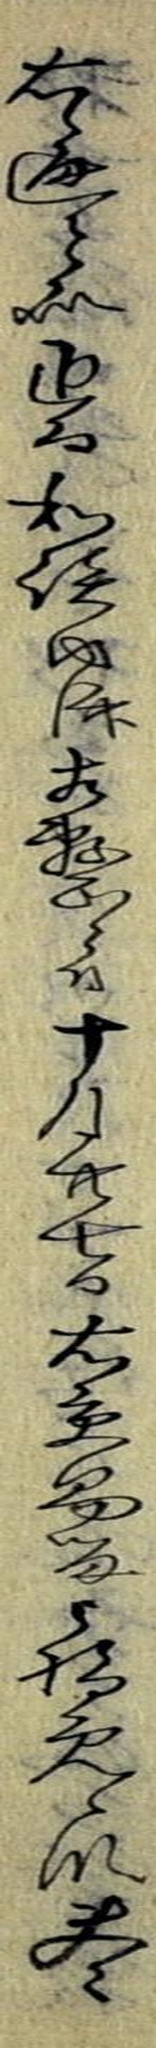右之通に候処追而和談内済相整候に付十月廿七日右交易留被指免候段夫々
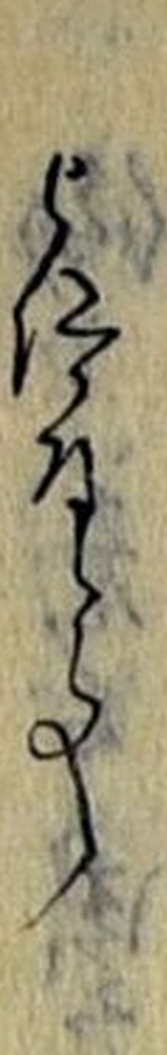被仰付候事
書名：命令之部 四
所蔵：福井県文書館 Fukui Prefectural Archives
